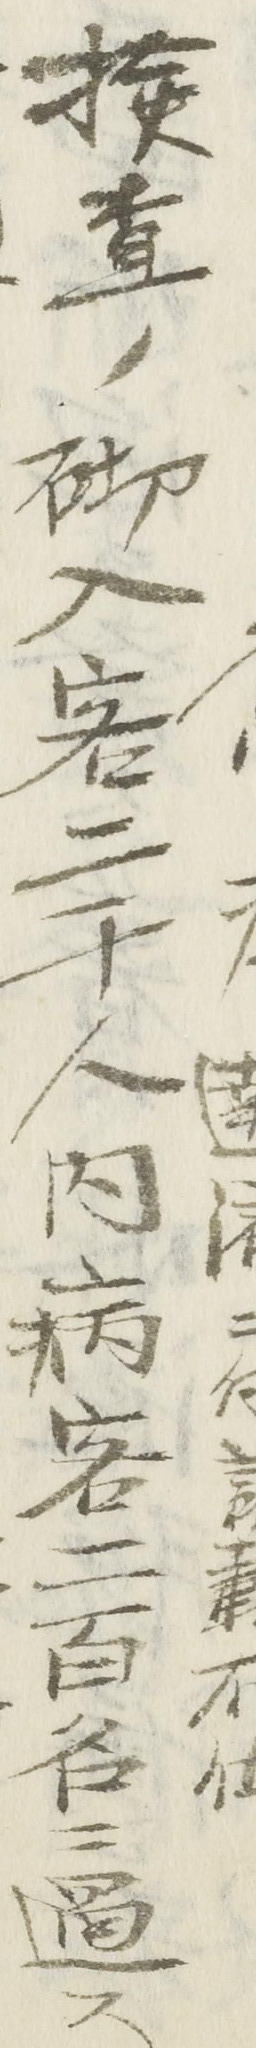検査ノ砌入客二千人内病客二百名ニ過ス
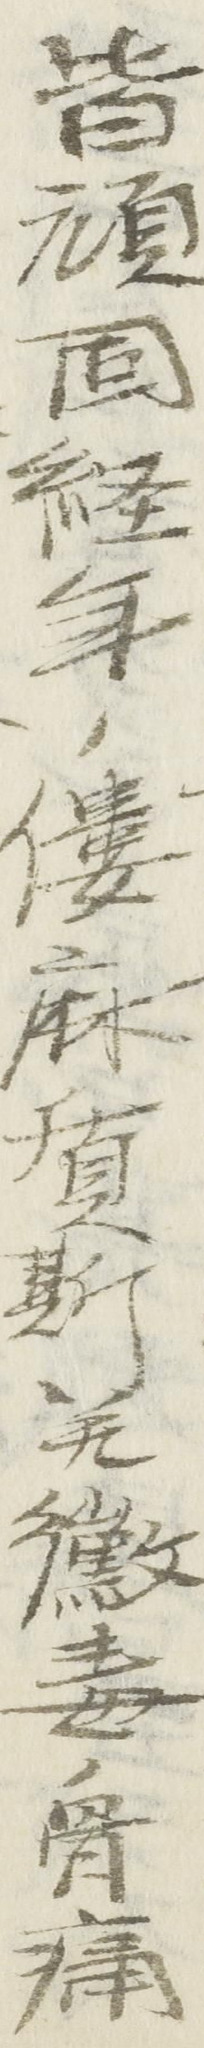皆頑固経年ノ僂麻質斯並黴毒ノ骨痛
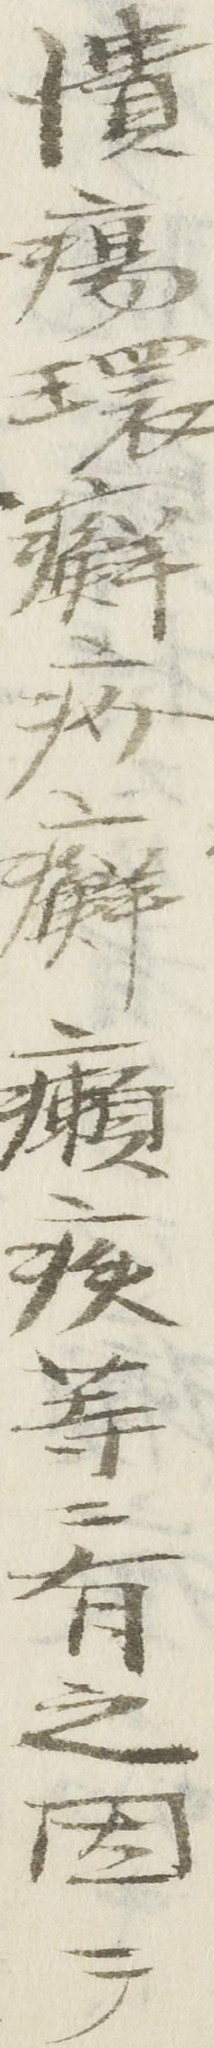潰瘍環癬疥癬癩疾等ニ有之因テ
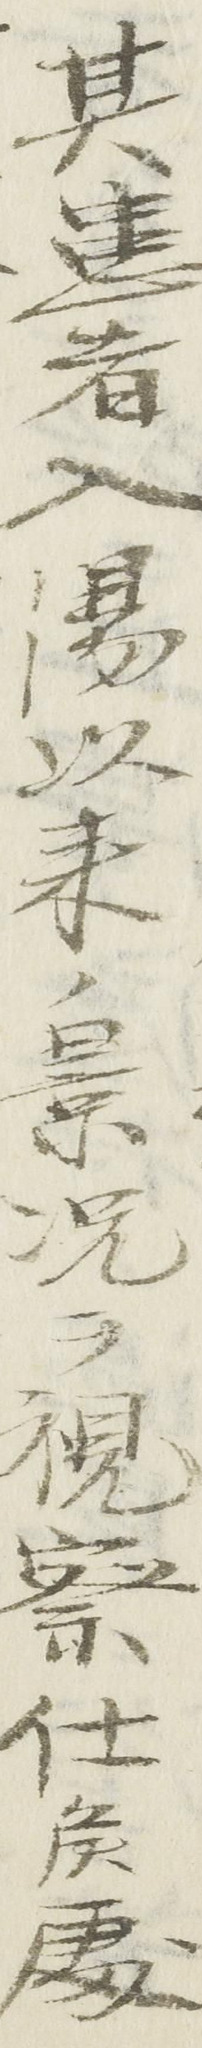其患者入湯以来ノ景況ヲ視察仕候処
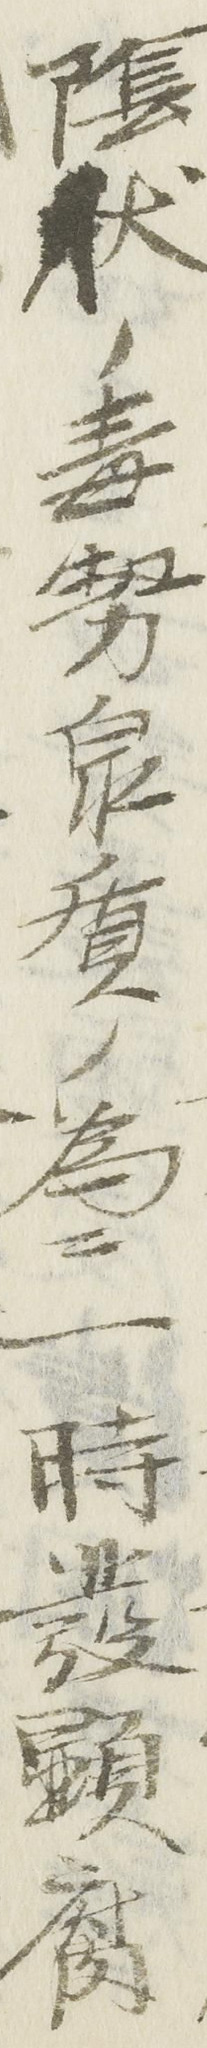陰状ノ毒勢泉質ノ為ニ一時発顕腐
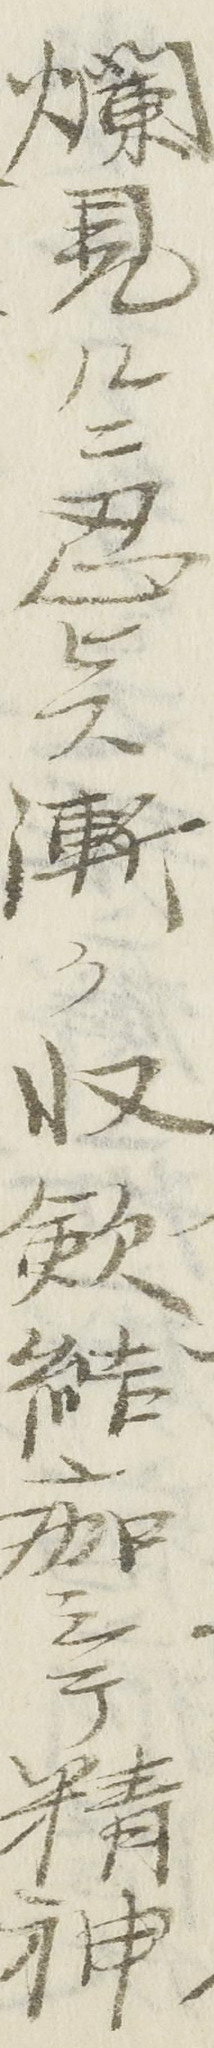爛見ルニ忍ヒス漸ク収斂結痂シテ精神
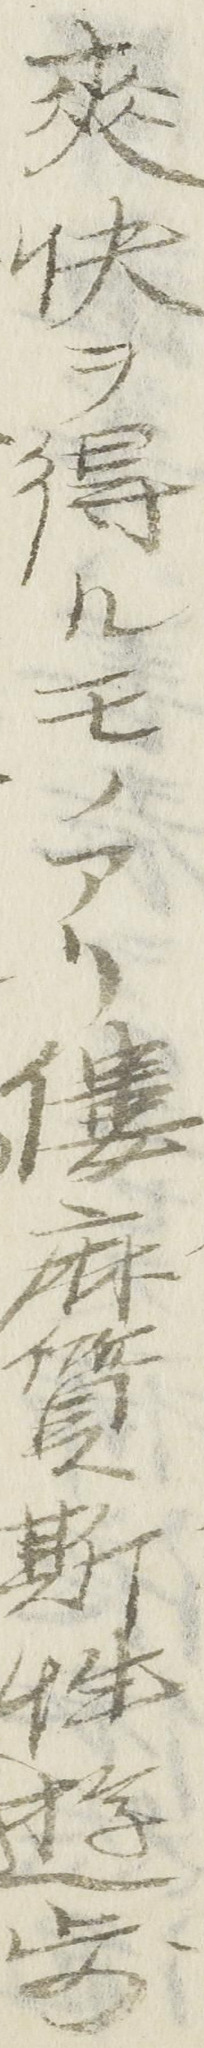爽快ヲ得ルモノアリ僂麻質斯性遊歩
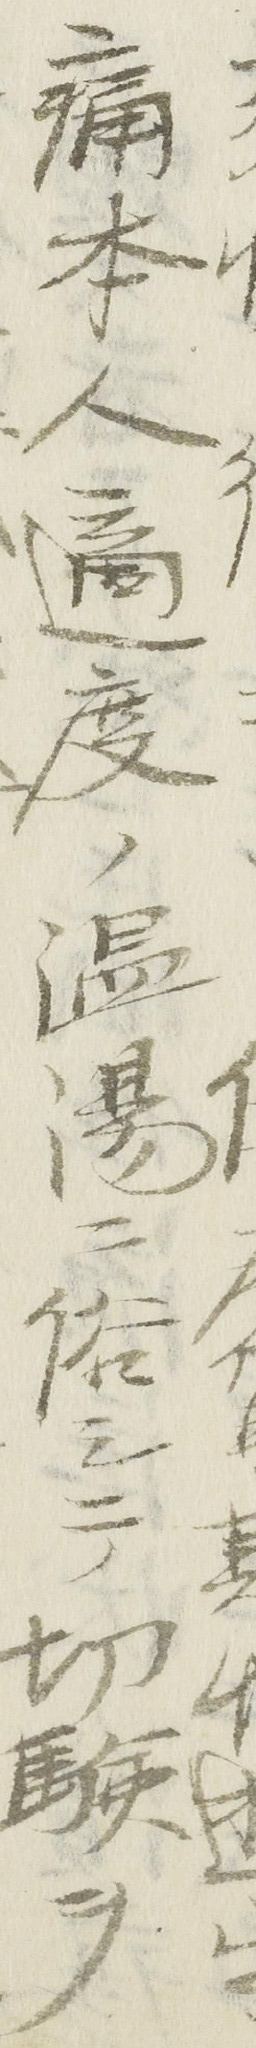痛本人適度ノ温湯ニ浴シテ切験ヲ
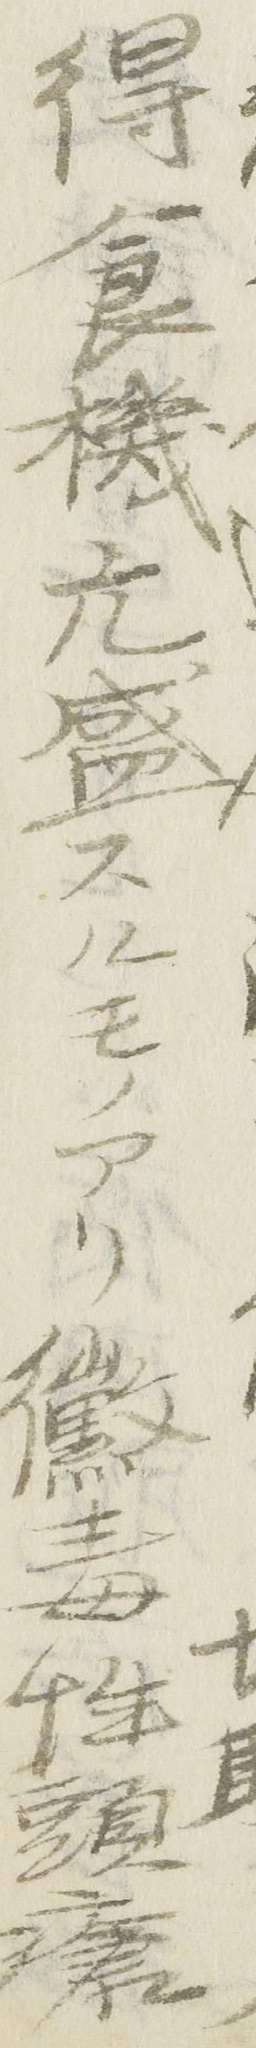得食機亢盛スルモノアリ黴毒性頭瘡

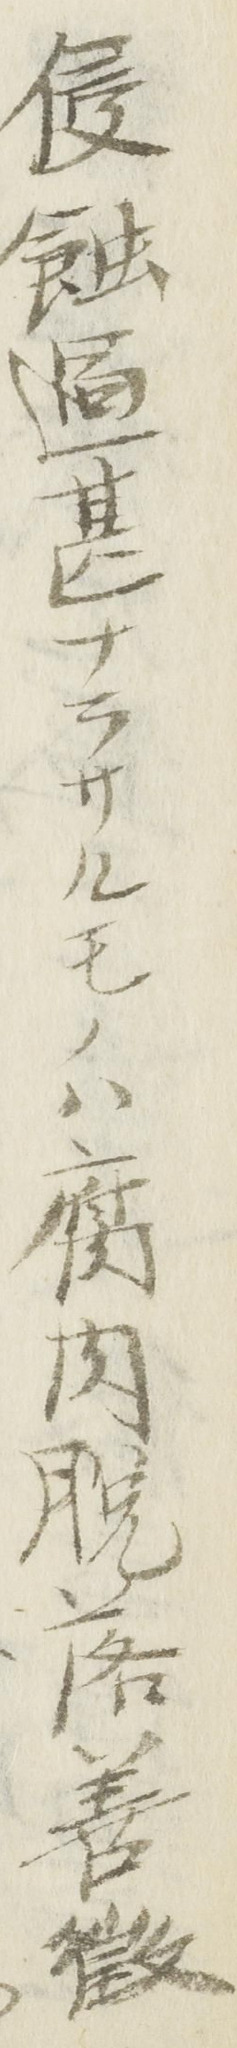浸蝕過甚ナラサルモノハ腐肉脱落善徴
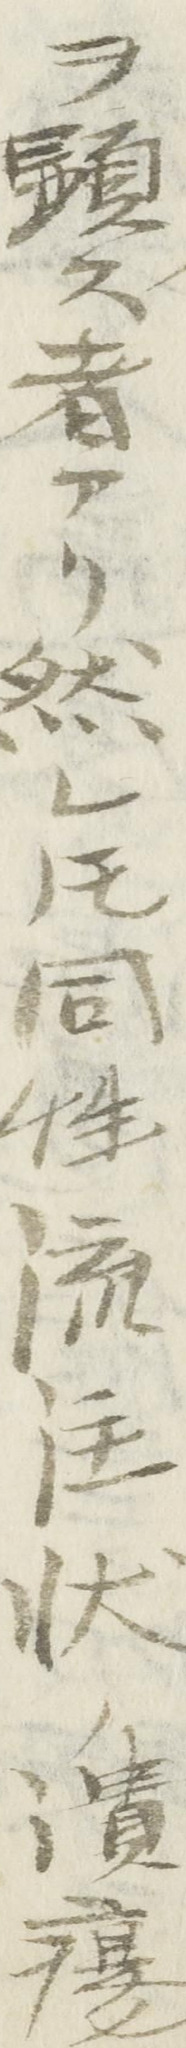ヲ顕ス者アリ然レトモ同性流注状ノ潰瘍
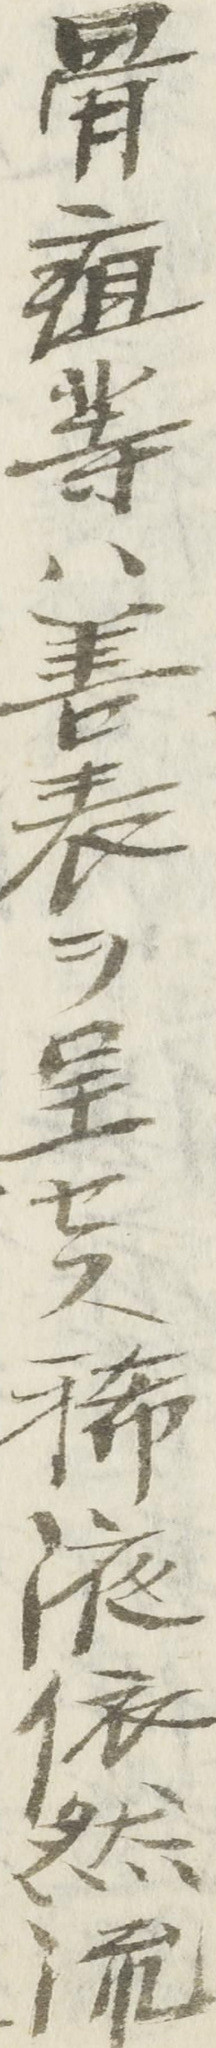骨疽等ハ善表ヲ呈セス稀液依然流
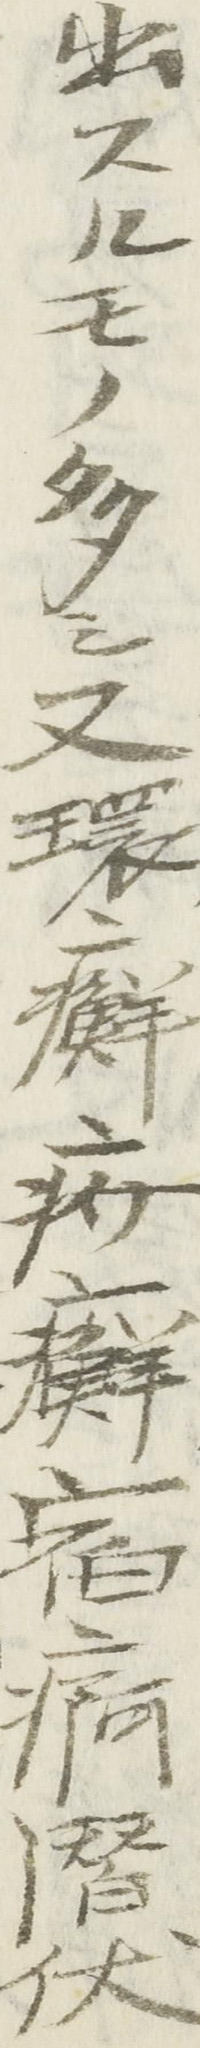出スルモノ多シ又環癬疥癬宿病潜伏
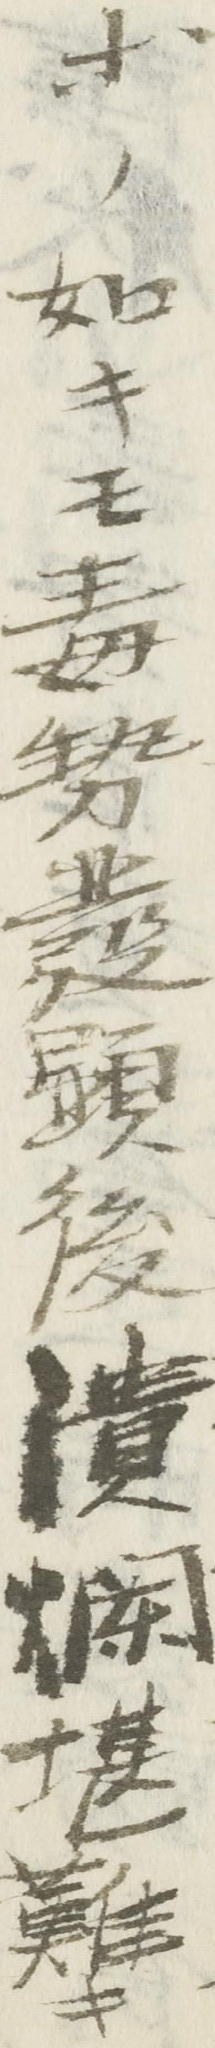等ノ如キモ毒勢発顕後潰爛堪難キ
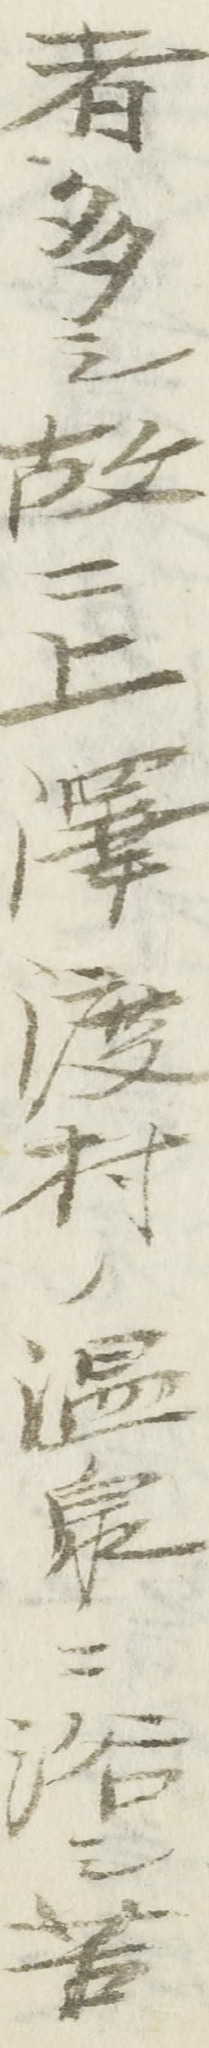者多シ故ニ上澤渡村ノ温泉ニ浴シ苦
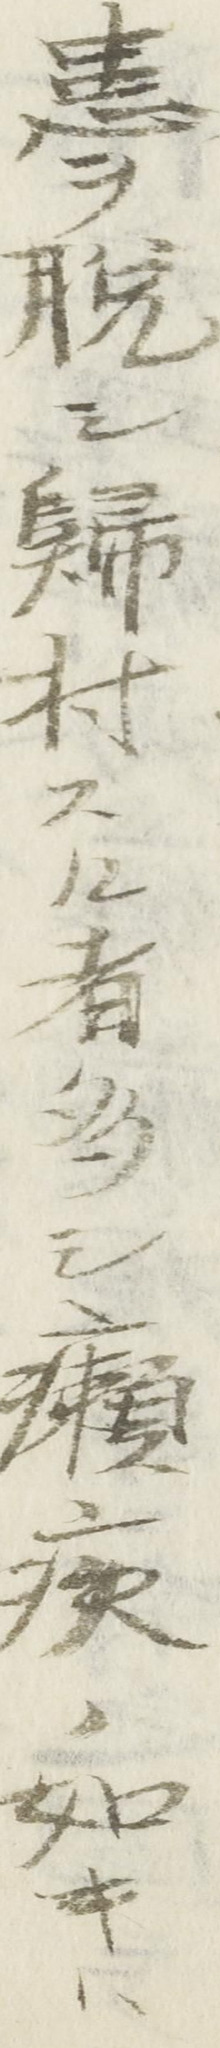患ヲ脱シ帰村スル者多シ癩疾ノ如キハ
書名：温冷泉試験表
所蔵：東京大学地震研究所図書室 Earthquake Research Institute Library, The University of Tokyo, JAPAN
